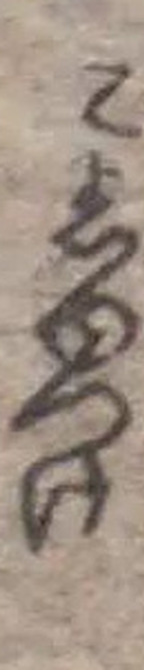ごしゆつけ
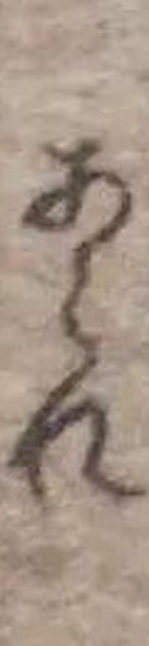あられ
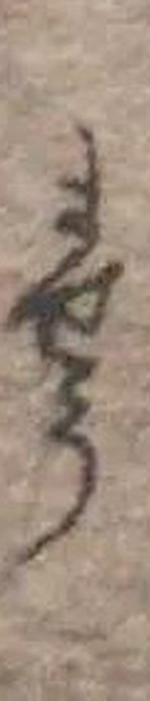ませう
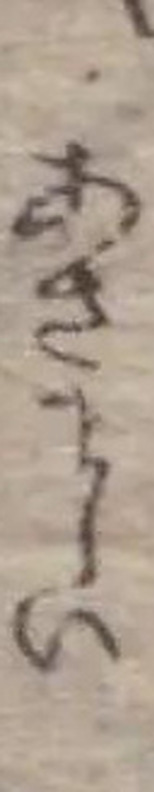あさましい
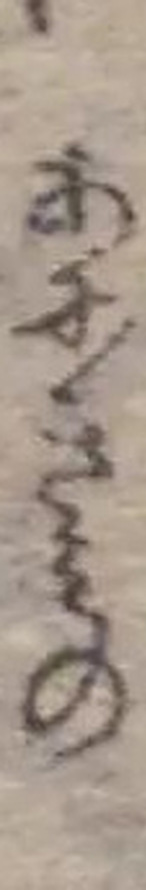あにきみの
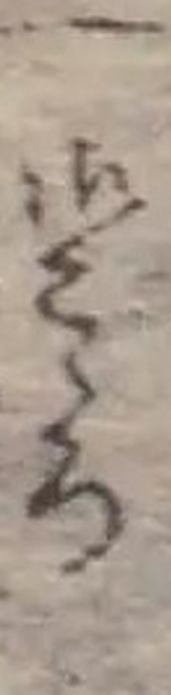御こゝろ
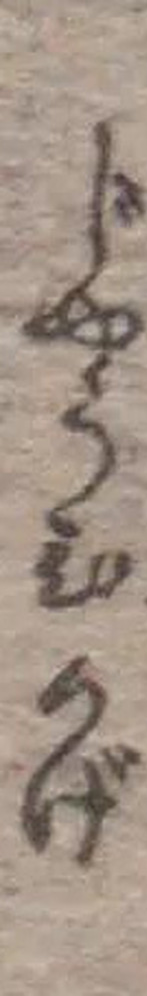じやうひかげ
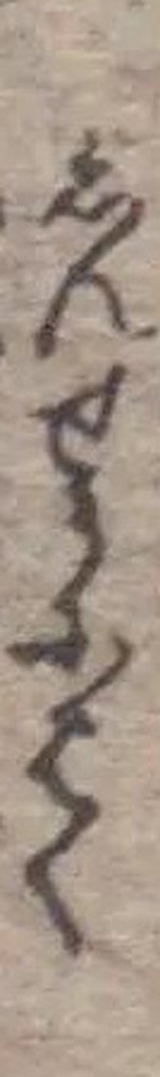しんせうにはく

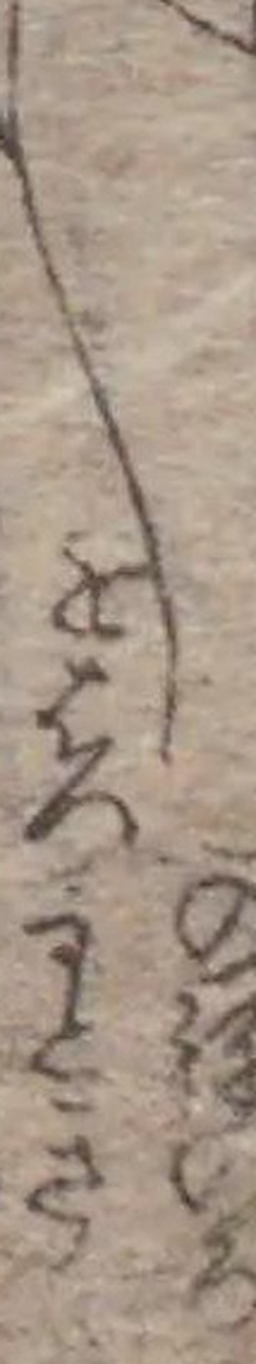をはつすときゝ
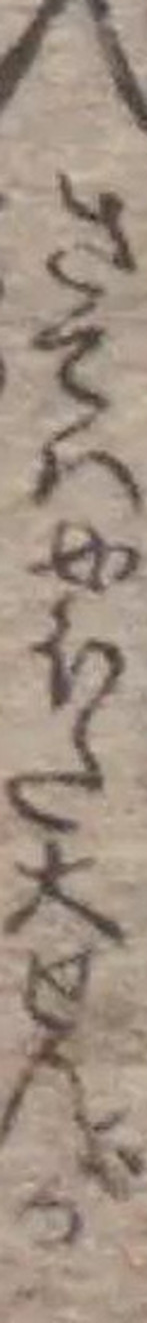さてはやほた大せんが
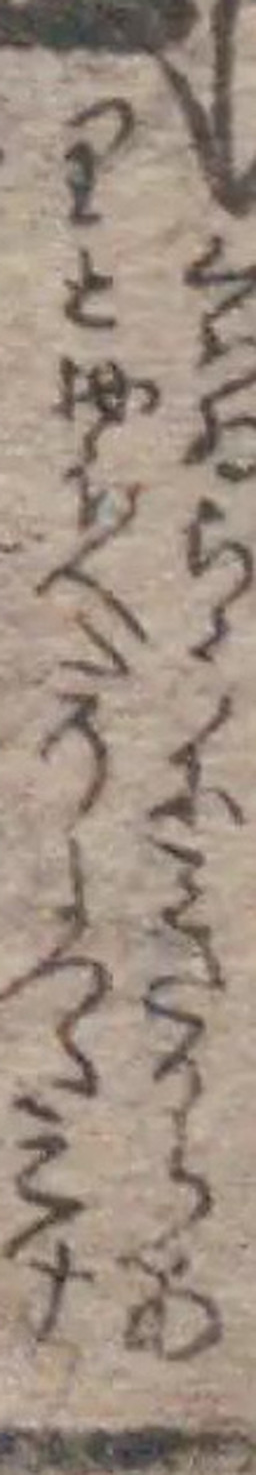りとおほへたりしつたこけ
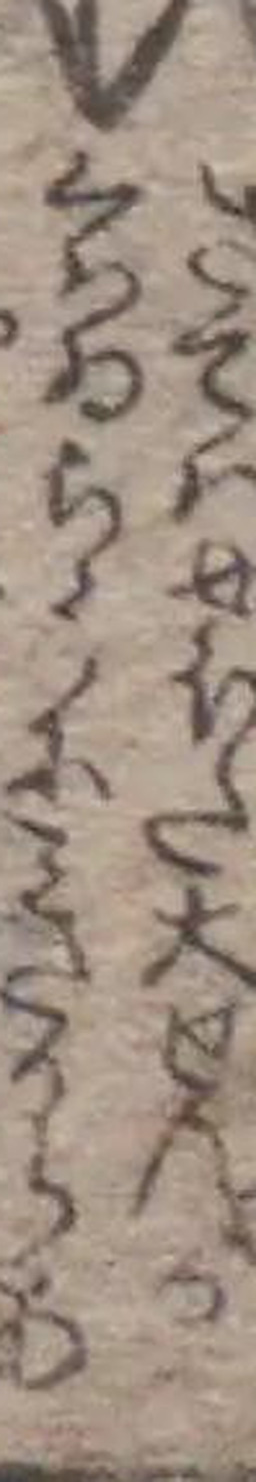くはゐちうにみたからあ
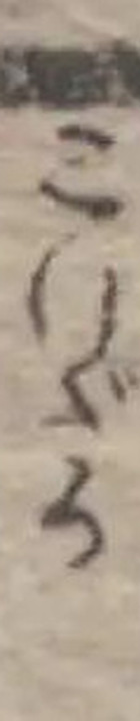こけだか
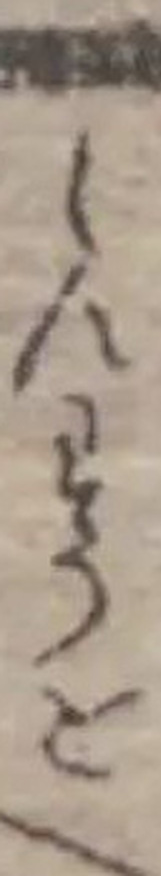しんわうを
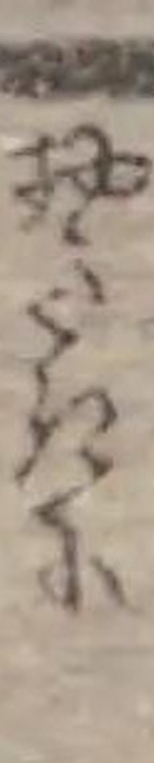おたきに
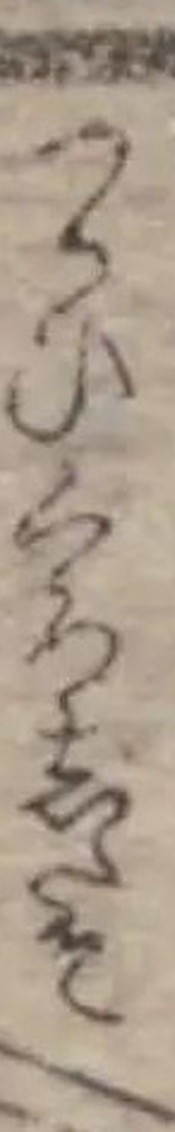つかひくろしたて
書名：富多高慢噺 3巻
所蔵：国立国会図書館 National Diet Library, JAPAN
